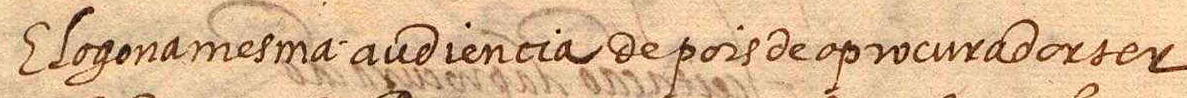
E Logo na mesma audiencia depois de o procurador ter
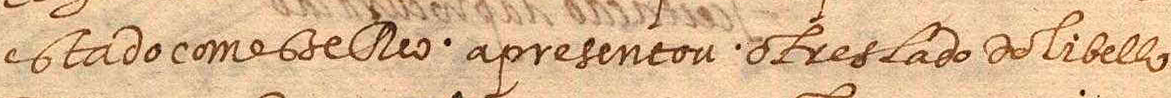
estado com este Reo . apresentou . o treslado do libello
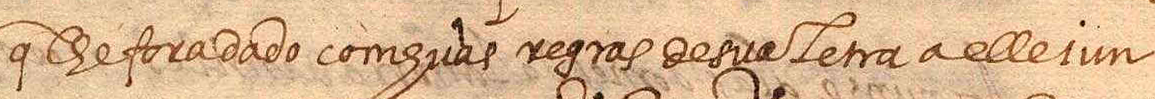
q̄ lhe fora dado com huās regras de sua Letra a elle iun
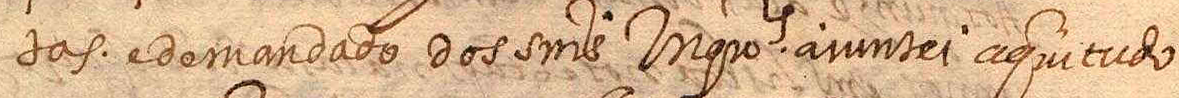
tas. e do mandado dos snēs Inqures aiuntei aqui tudo
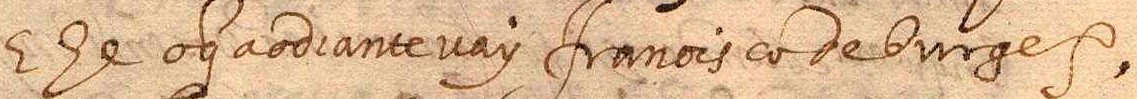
E he o q̄ ao diante uay francisco de bruges
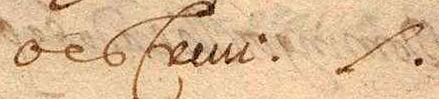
o esCreui. / .
